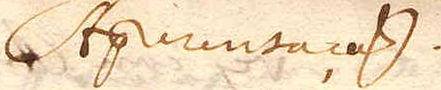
Aprezentaçaõ.
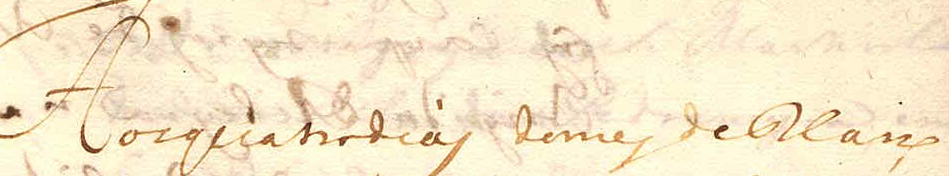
Aos quatro dias do mes de Março
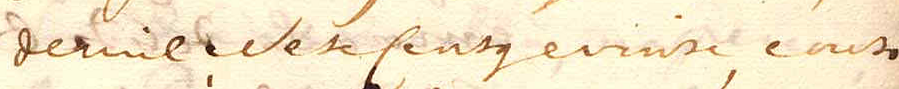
de mil, e seteCentos e vinte, e outo
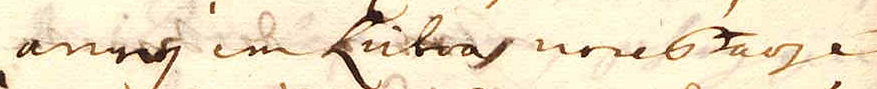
annos em Lisboas nos estaos, e
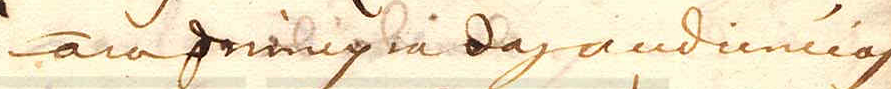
Casa primeyra das audiencias
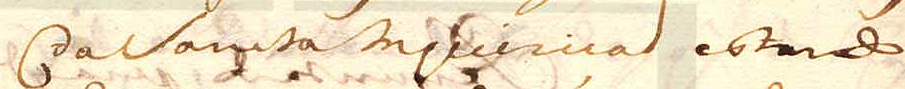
da Santa Inquiziçaõ estando
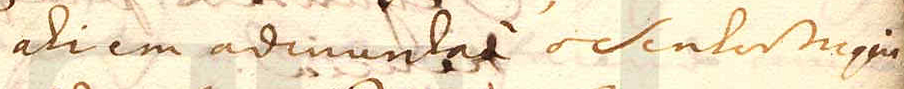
ahi em a di menhaã o Senhor Inqui
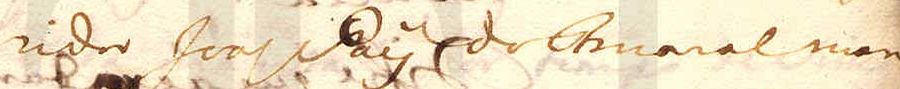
zidor Joao Paês do Amaral man
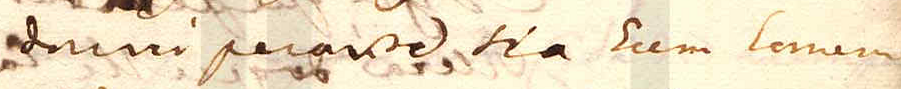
dou vir perante sy a hum homem
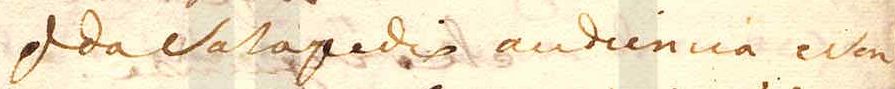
q̄ da sala pedio audiencia, e sen
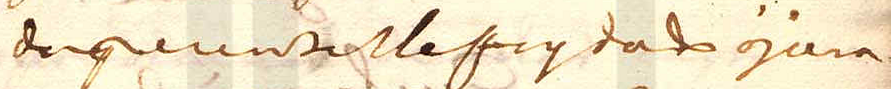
do prezente lhe foy dado o jura
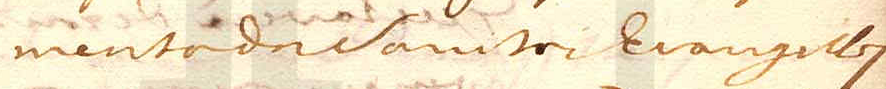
mento dos Santos Evangelhos
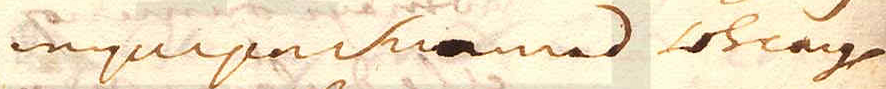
em que pos Sua maõ sobcargo
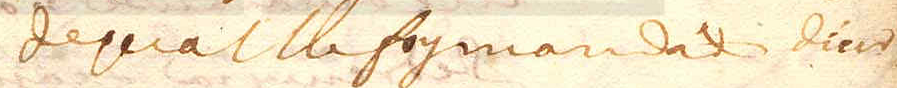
do qual lhe foy mandado dizer
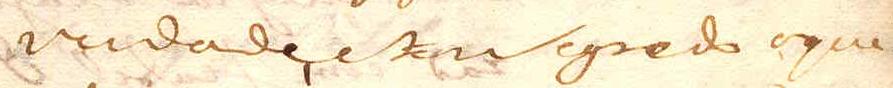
verdade e ter segredo o que
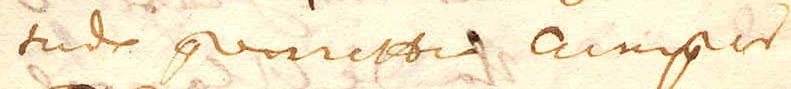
tudo pometteo cumprir
